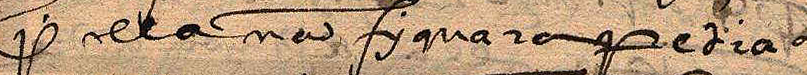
p̄o ella não fyquara pedia a
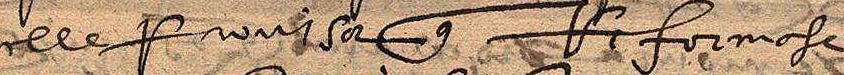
elle prouisor q̄ Reformase
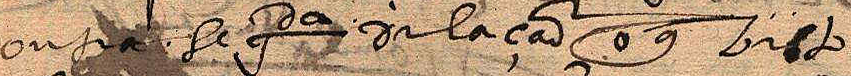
outra segda dilação o q̄ visto
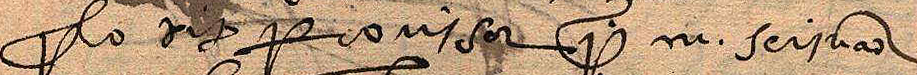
p̄lo dito proujsor p̄o eu scrjuão
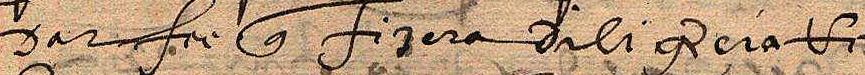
dar fee q̄ fizera diligēçia a Re
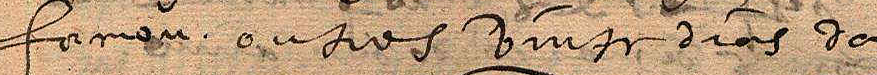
formou outros vinte dias da
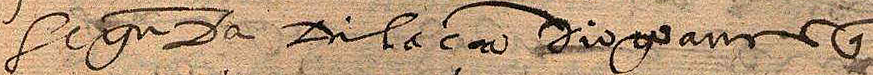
seḡuda Dilação diogo aires q̄
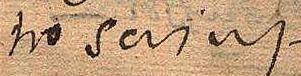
ho scriuj
